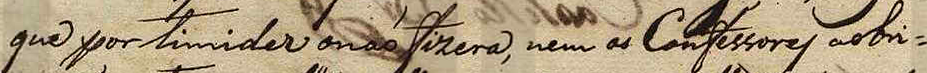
que por timidez o naõ fizera, nem os Confessores a obri
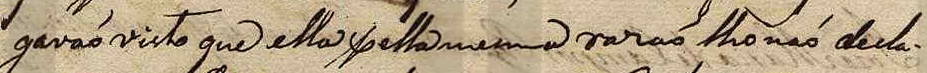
gavaõ visto que ella pella mesma razaõ lho naõ decla
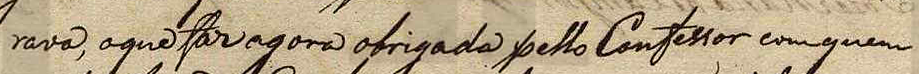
rava, o que faz agora obrigada pello Confessor com quem
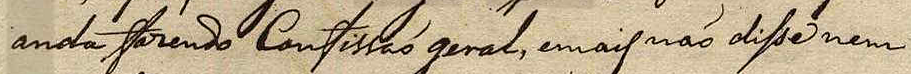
anda fazendo Confissaõ geral, e mais naõ disse, nem
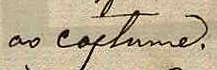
ao costume.
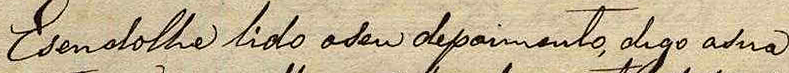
E sendolhe lido o seu depoimento, digo a sua
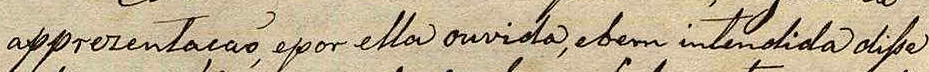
apprezentaçaõ, e por ella ouvida, e bem intendida disse
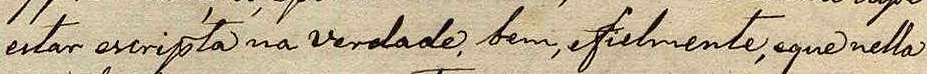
estar escripta na verdade, bem, e fielmente, e que nella
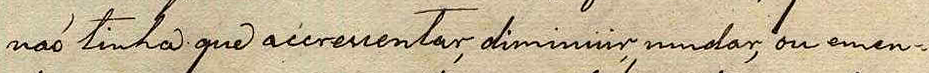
naõ tinha que accrescentar, diminuir, mudar; ou emen
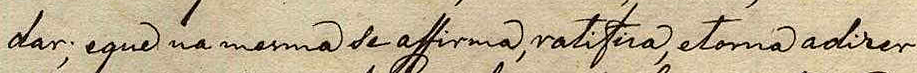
dar; e que na mesma se affirma, ratifica, e torma a dizer
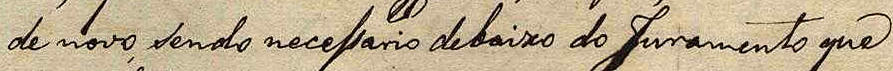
de novo, sendo necessario debaixo do Juramento que
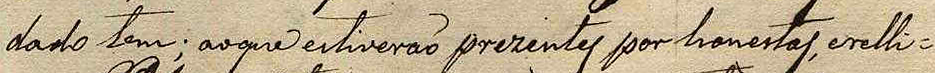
dado tem; ao que estiveraõ prezentes por honestas, e relli
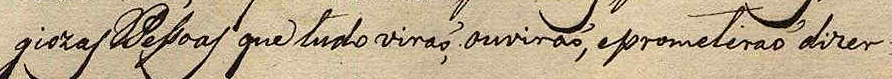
giozas Pessoas que tudo viraõ, ouviraõ, e prometiraõ dizer
